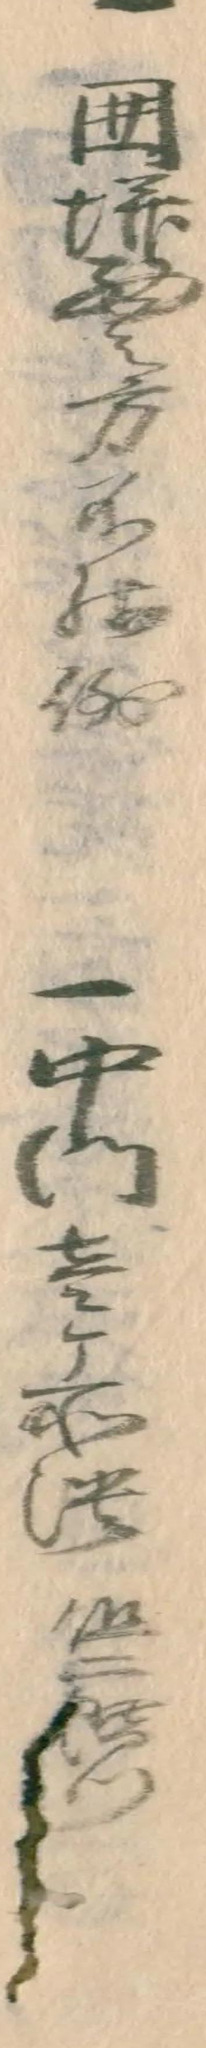一囲塀西ノ方不残倒一中門壱ヶ所潰但二階門
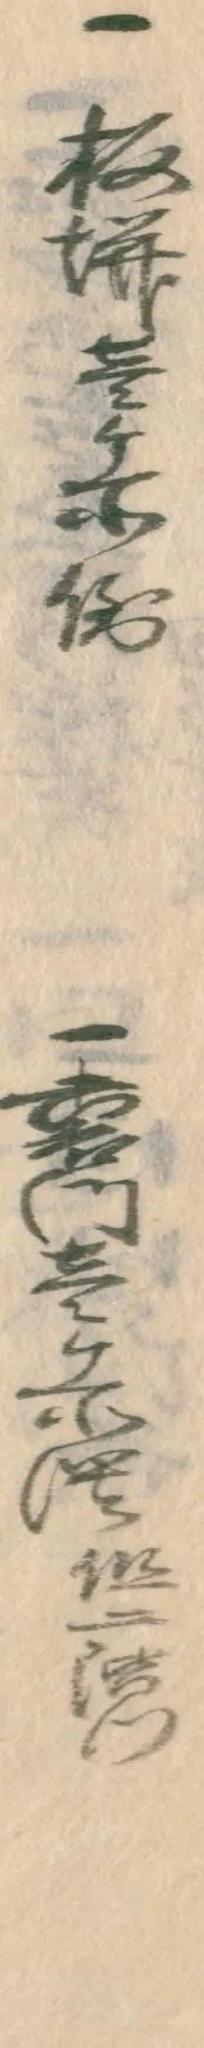一板塀壱ヶ所倒一裏門壱ヶ所潰但二階門
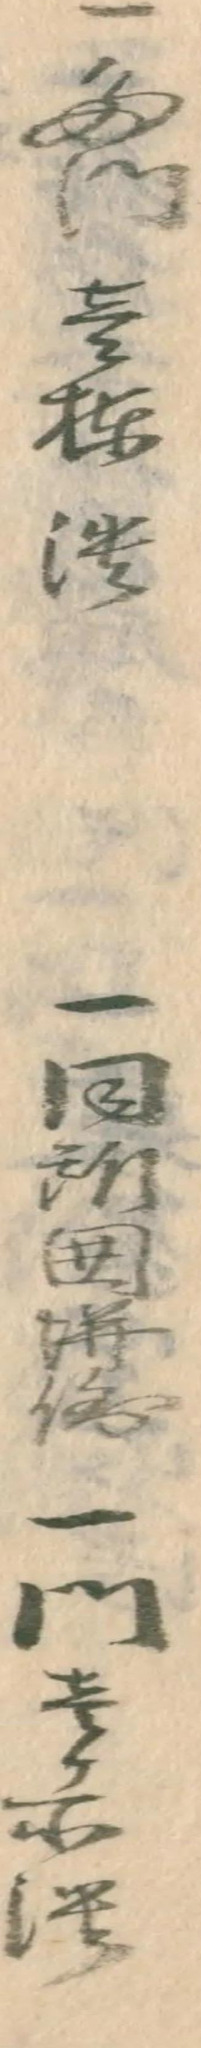一多門壱ヶ所潰一同所囲塀壱ヶ所潰

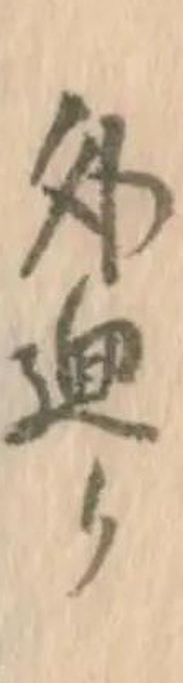外廻り
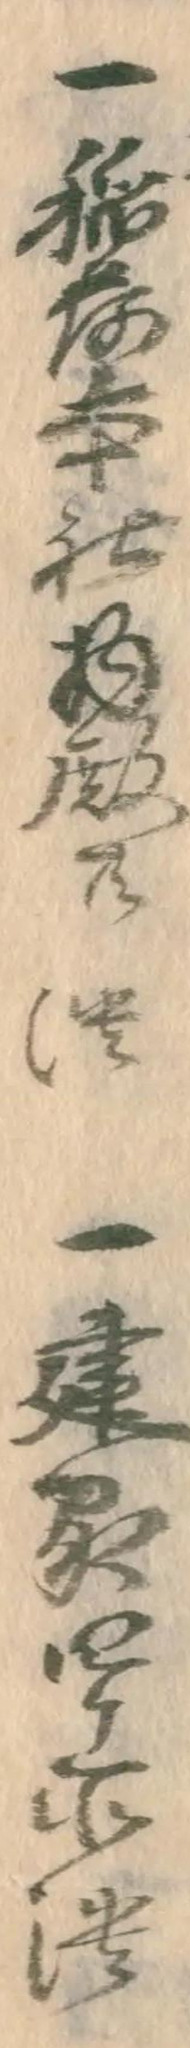一稲荷本社拝殿共潰一建家四ヶ所潰
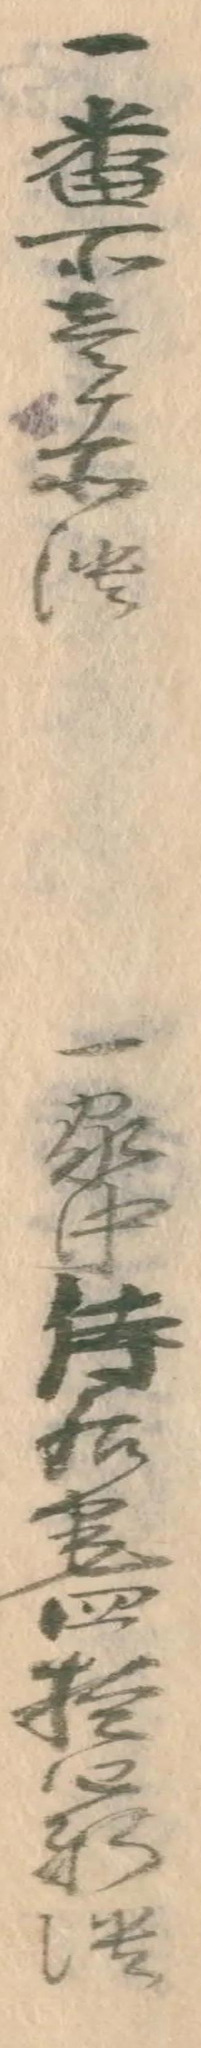一番所壱ヶ所潰一家中侍居宅四拾四軒潰
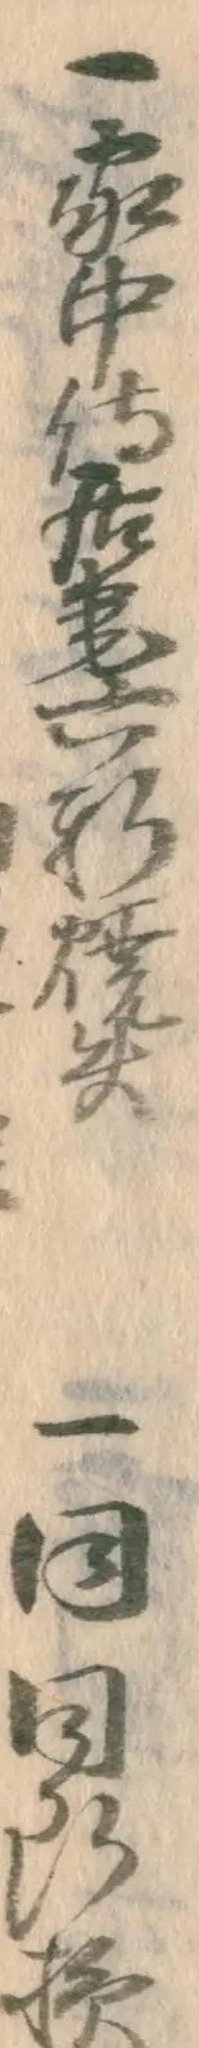一家中侍居宅六軒焼失一同同断損
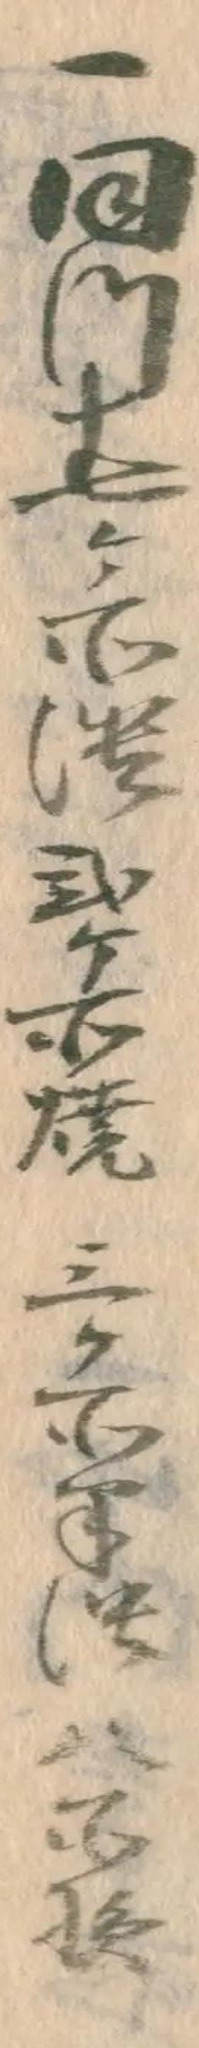一同門十七ヶ所潰弐ケ所焼三ヶ所半潰
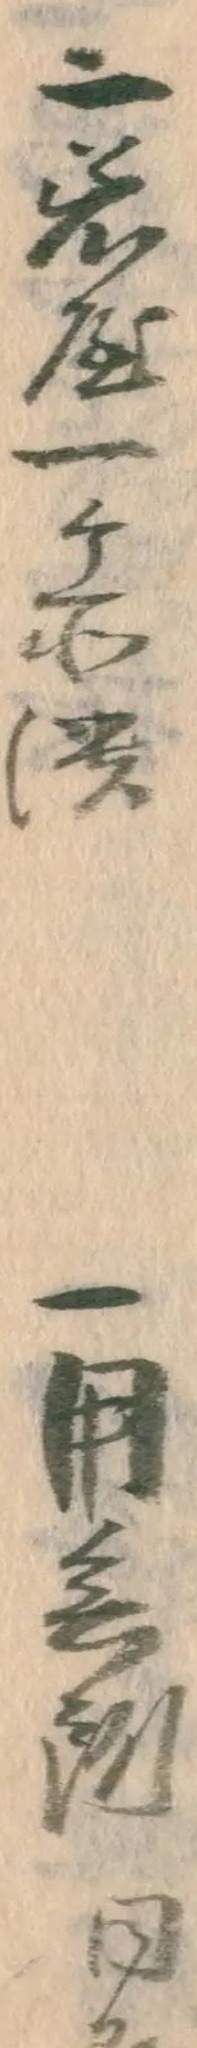一舂屋一ヶ所潰一用会所同断
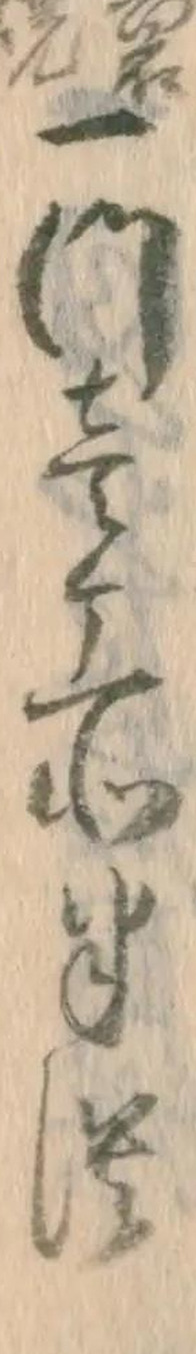一門壱ヶ所半潰
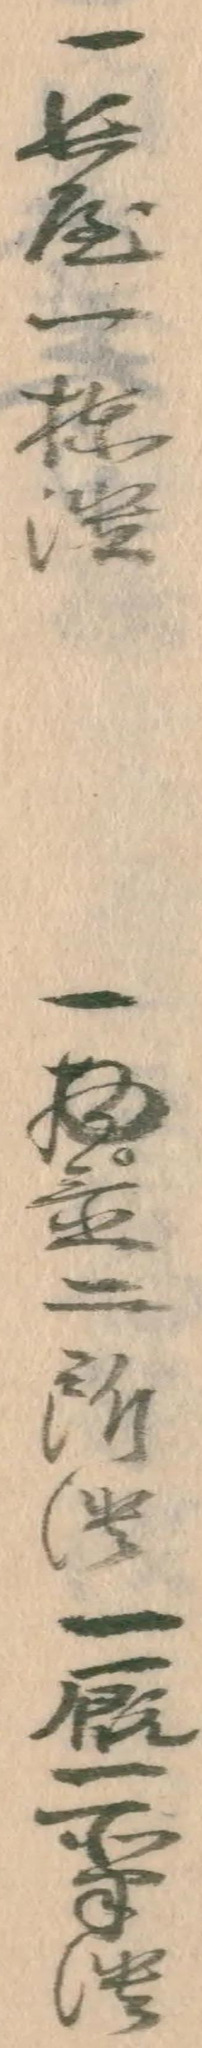一長屋一棟潰一物置二所潰一厩一所半潰
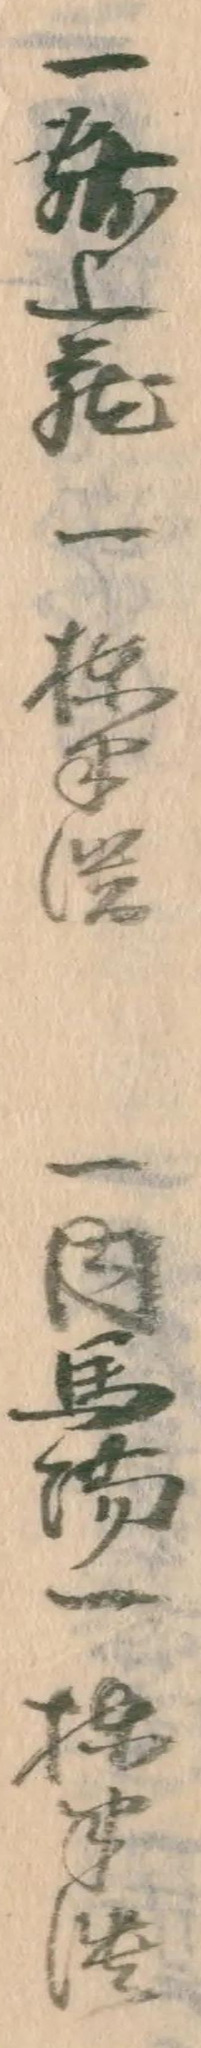一献上蔵一棟半潰一内馬場一棟半潰
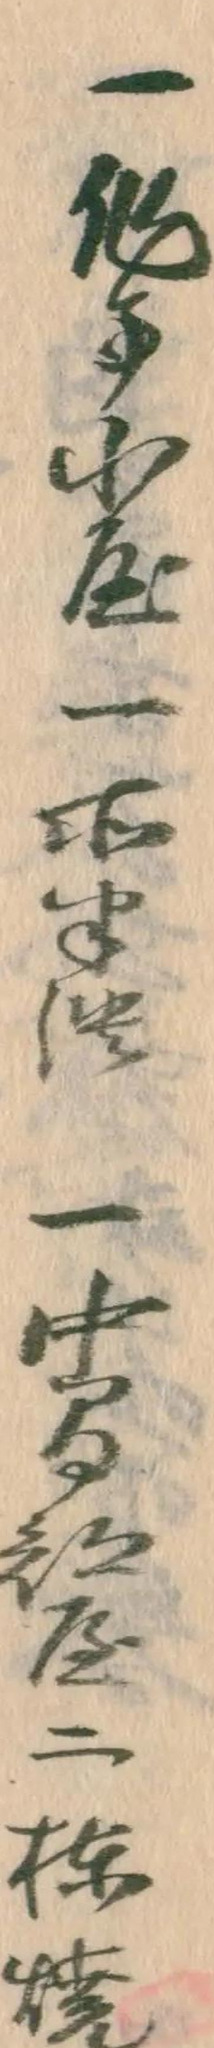一作事小屋一所半潰一中間部屋二棟焼
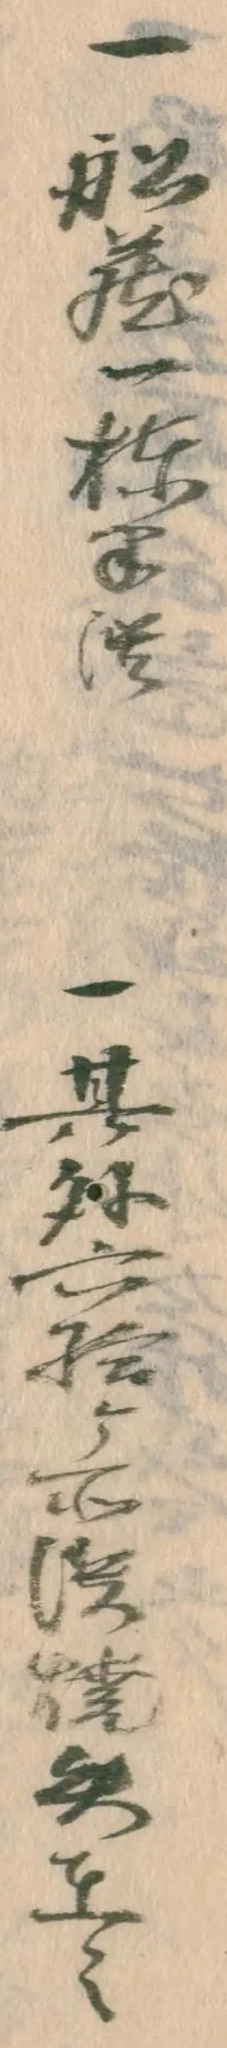一船蔵一棟半潰一其外六拾ヶ所潰焼失在之
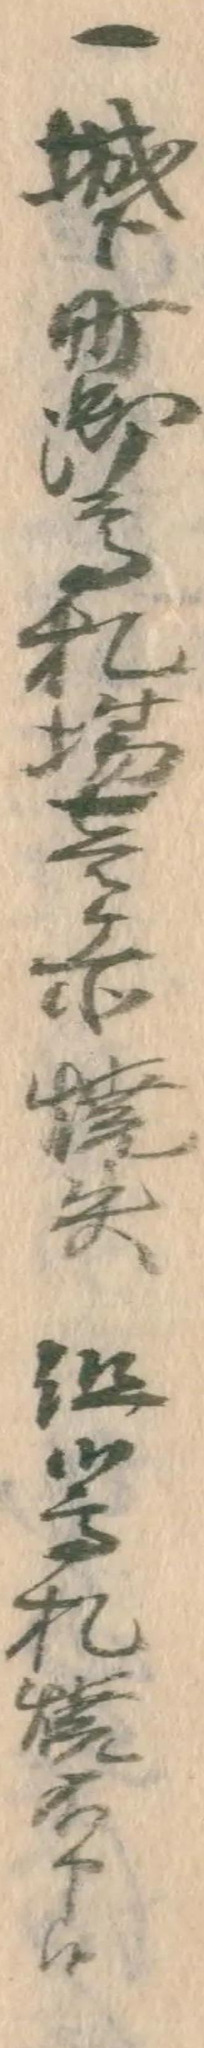一城下町御高札場壱ヶ所焼失但御高札焼不申候
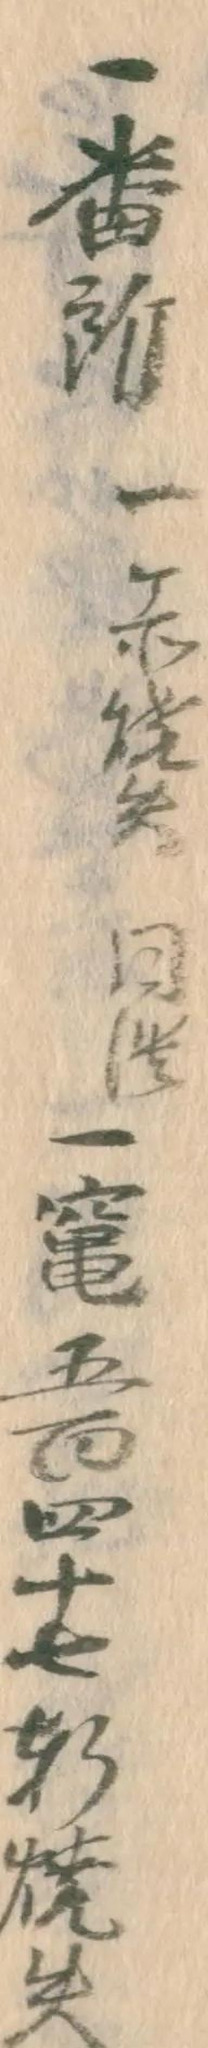一番所一ヶ所焼失同潰一竈五百四十七軒焼失
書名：信州大地震之記
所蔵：国立国会図書館 National Diet Library, JAPAN
